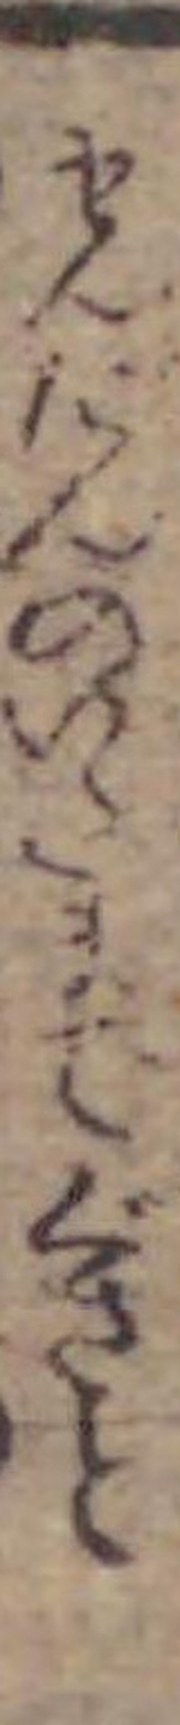せんだんのいたまでぐさと
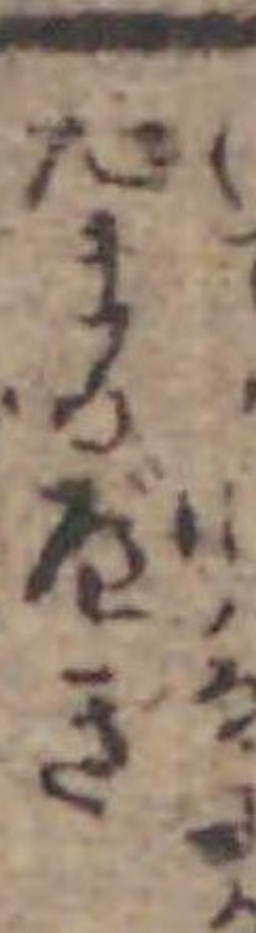たまるべき
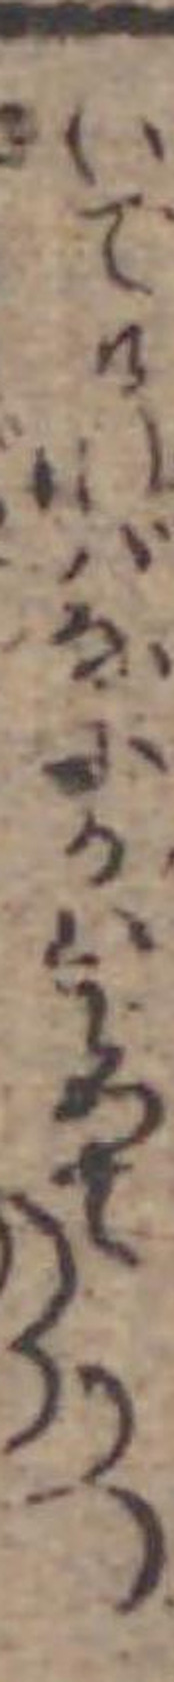いでければなにかはもつて
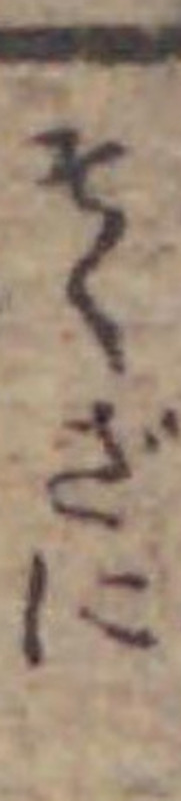そくざに
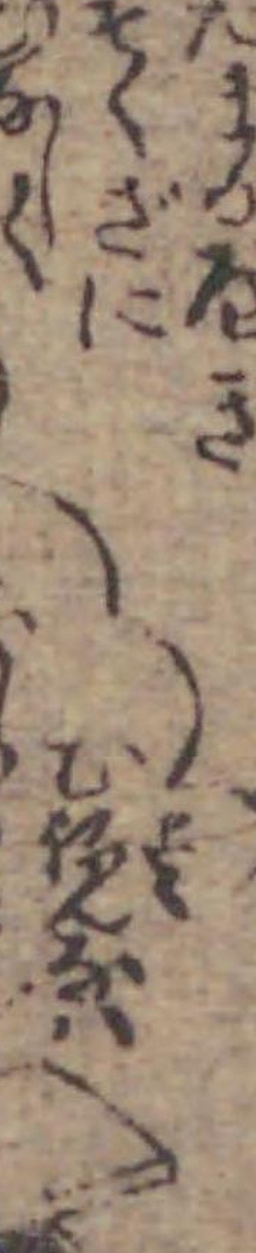むねんなは
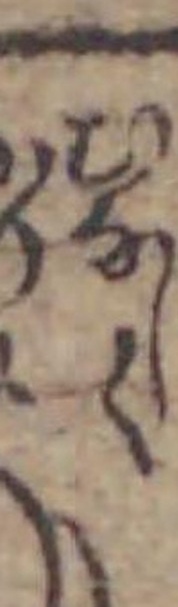むなしく
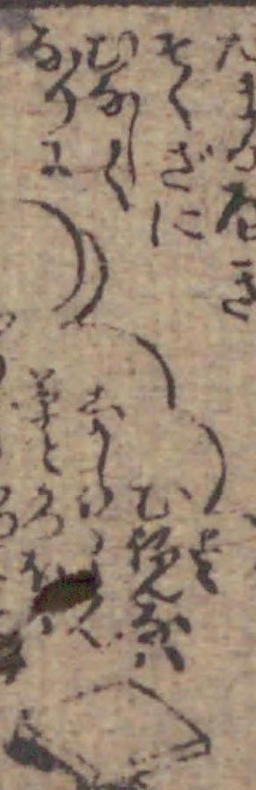なりに
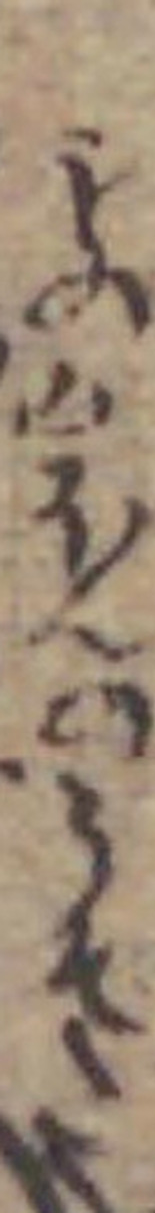ものはほんのうそた
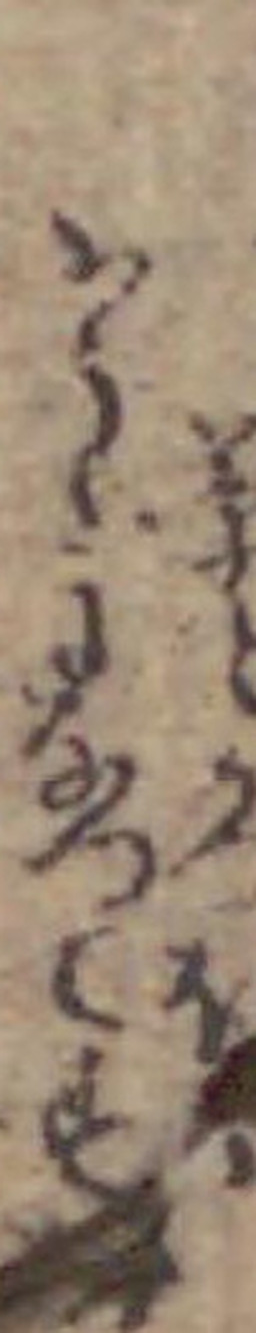ふうふになつてすむ
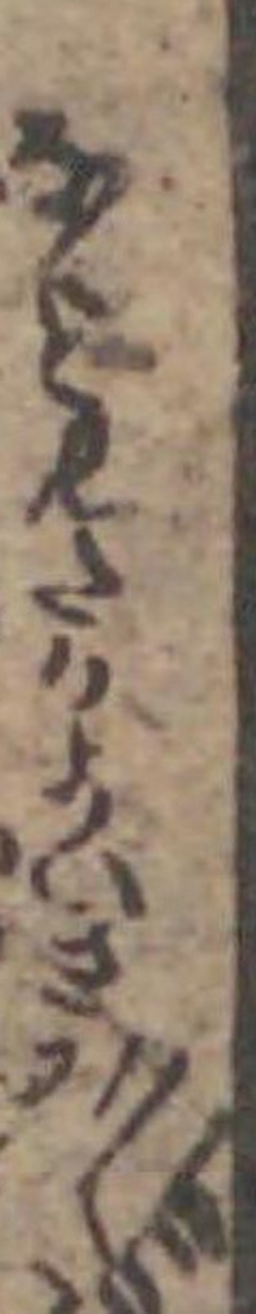なんと見たりよいきみ〳〵
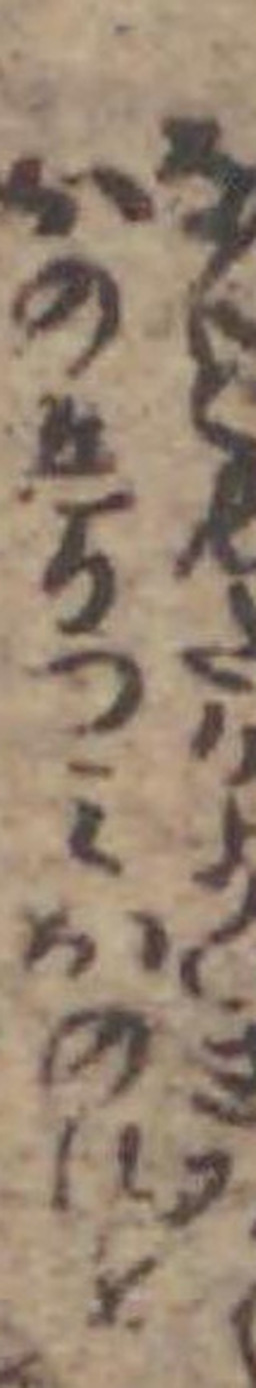おのれかつみおのれを
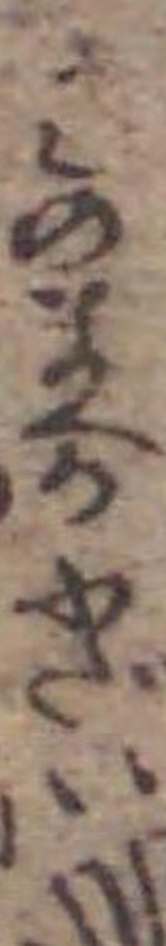みのまへがふだい
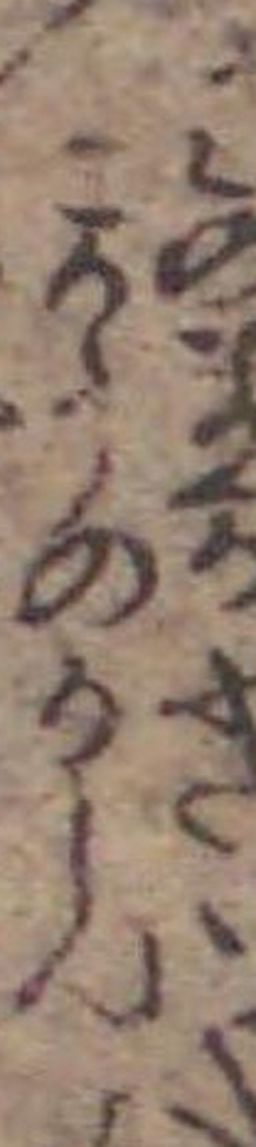ここうのかしん
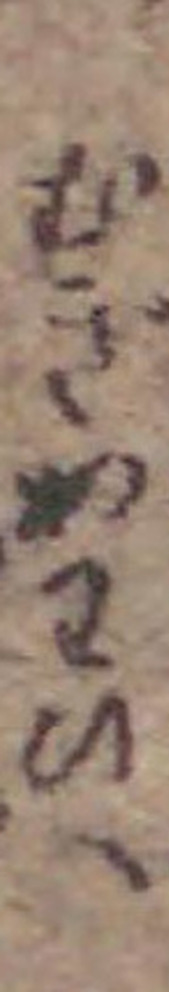むぎあわひへ

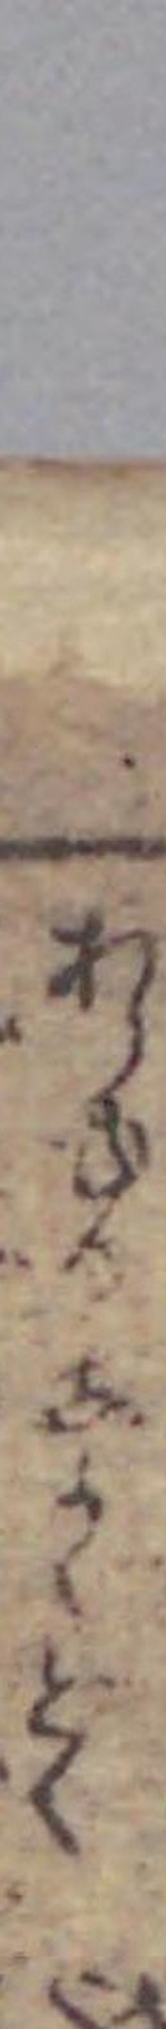あらゆるしよくどく
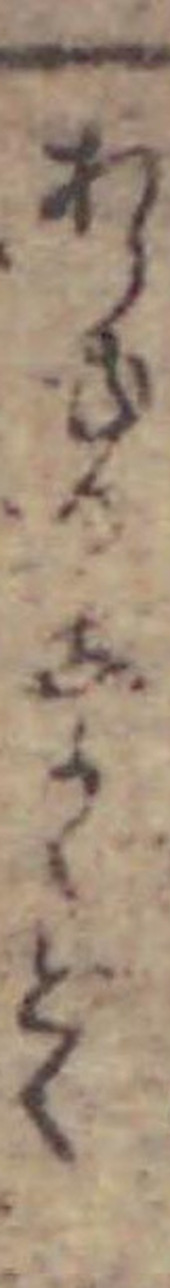あらゆるしよくどく
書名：腹京師食物合戦 : 2巻
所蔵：国立国会図書館 National Diet Library, JAPAN
